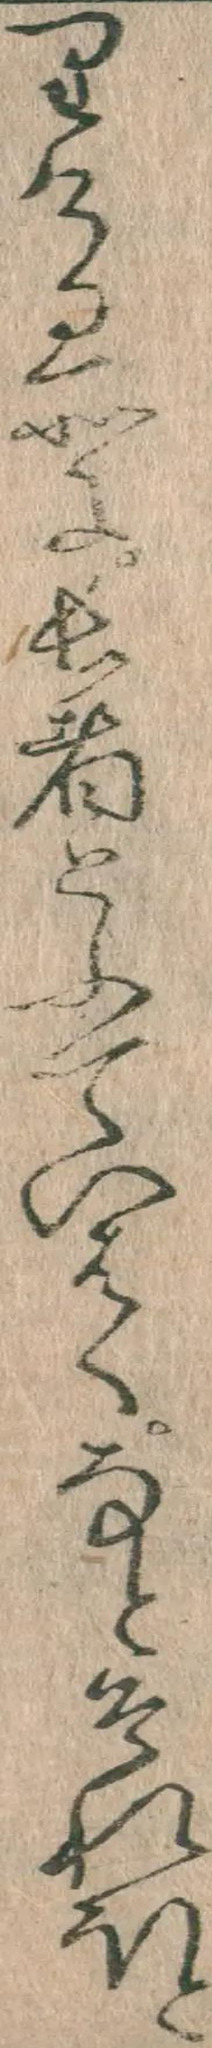りける所に。長者とふていはく。なとそれほと
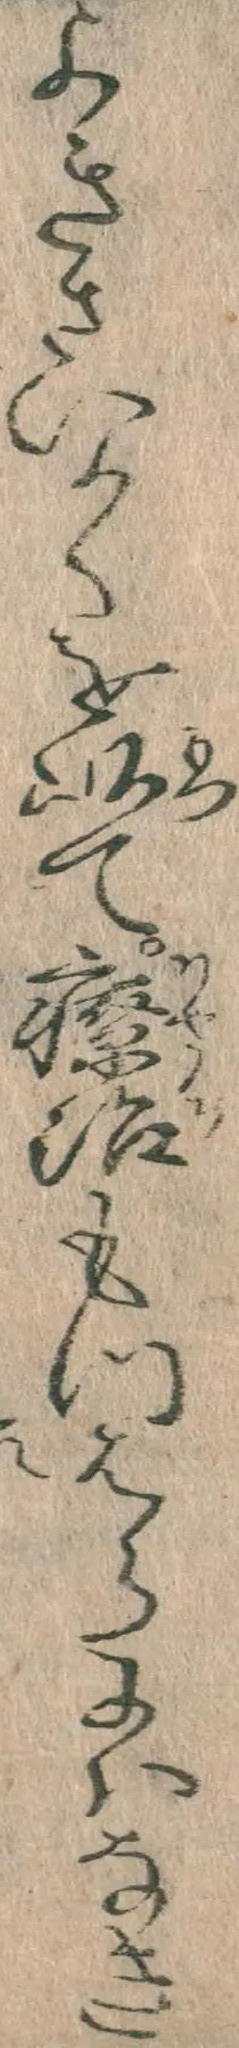よきさいかくを以て。療治もつはらにはなき
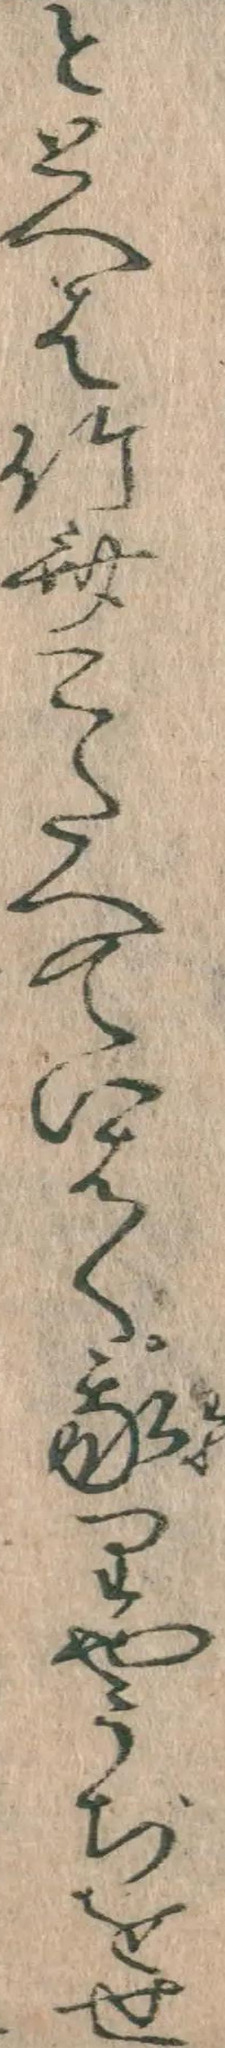ととへは竹斎こたへていはく。我りやうぢをせ
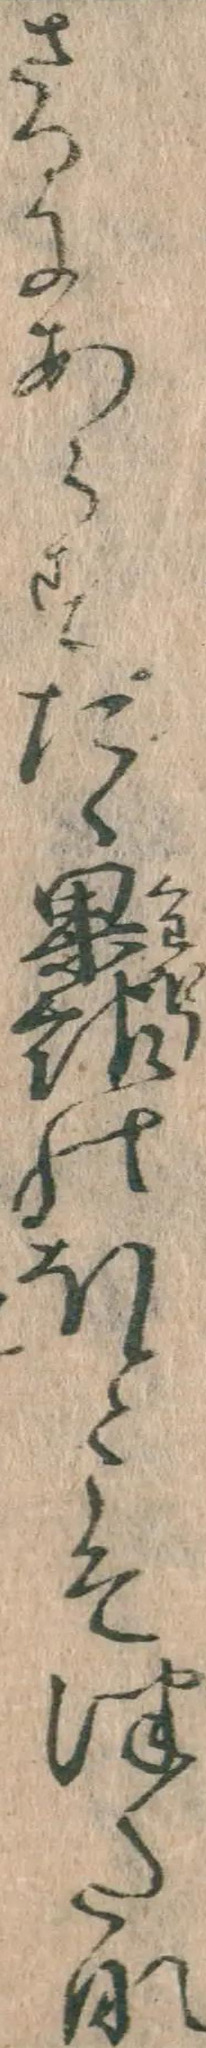さるにあらす。たゝ果報のほとこそつたな
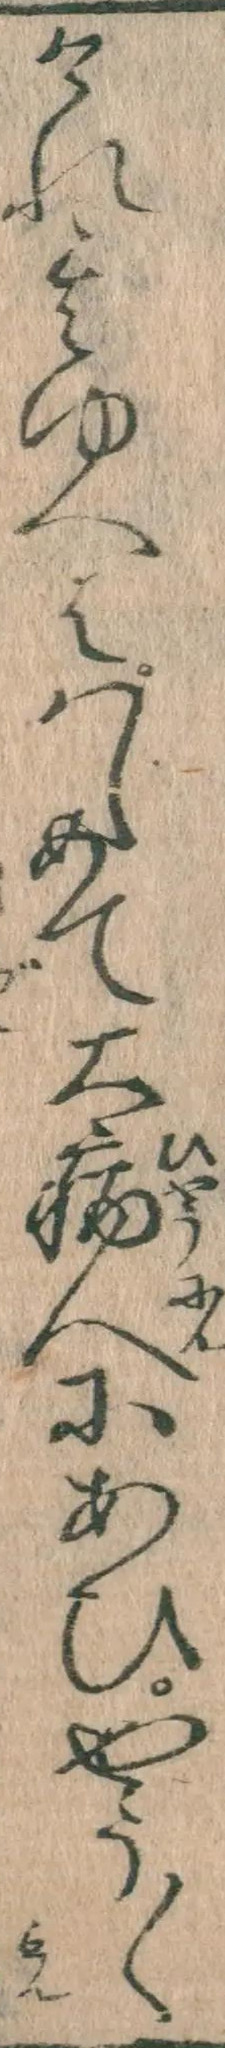けれ其ゆへは。はしめて大病人にあひ。やう〳〵
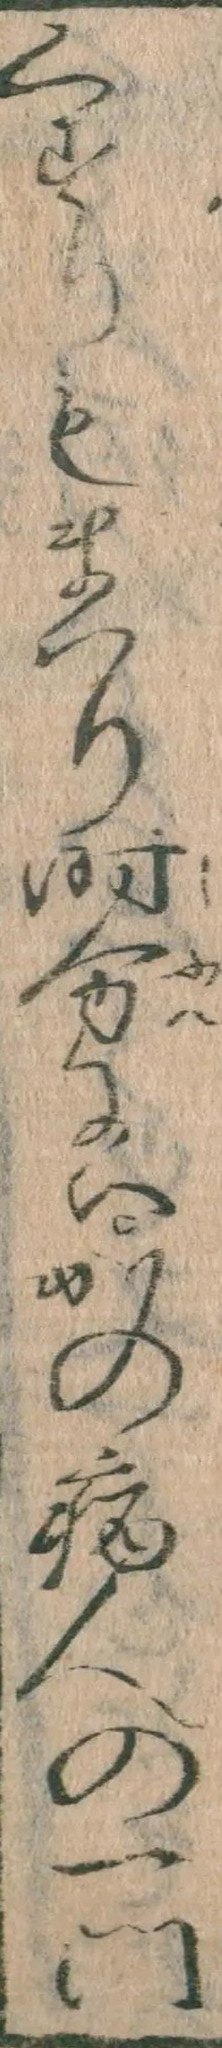くすりもまはり時分には。かの病人の一門
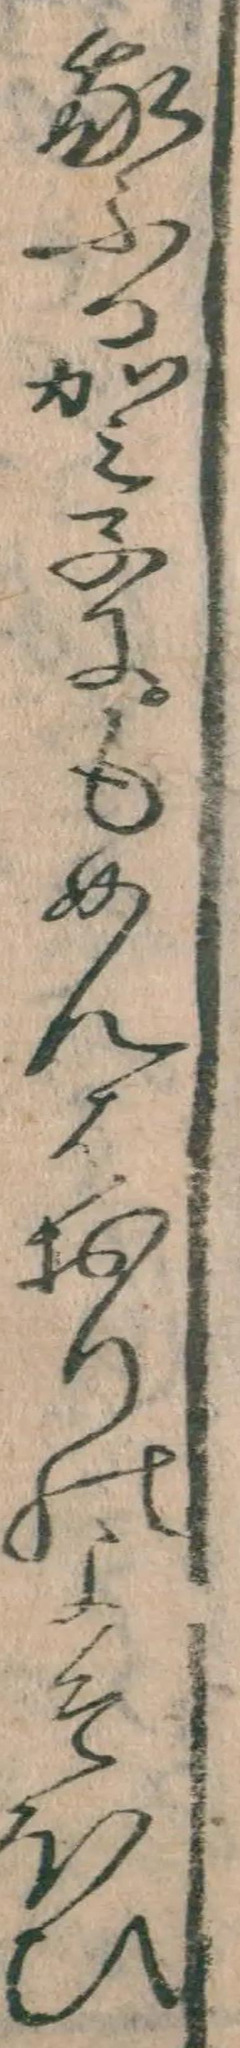我ふるかみ子に。もめんはおりのよそほひ
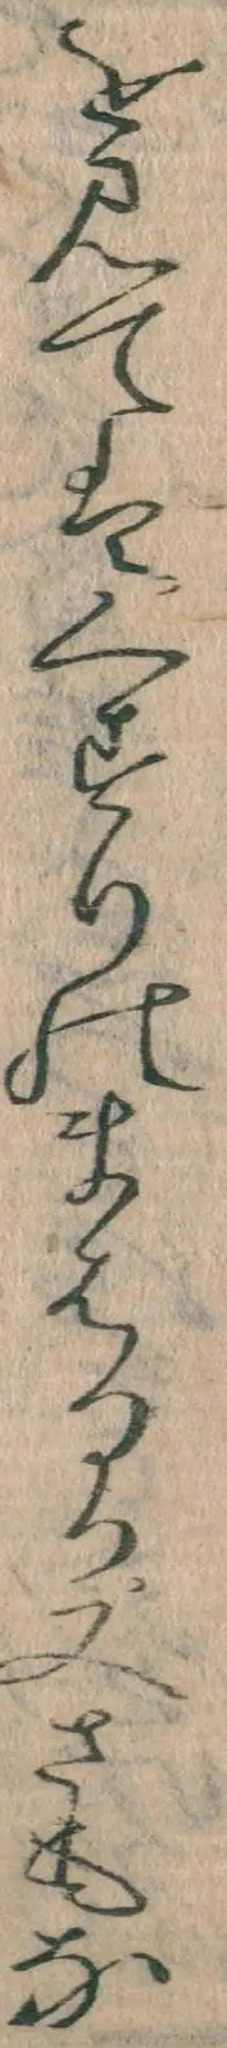を見ては。くすりのまはるか。又さもな
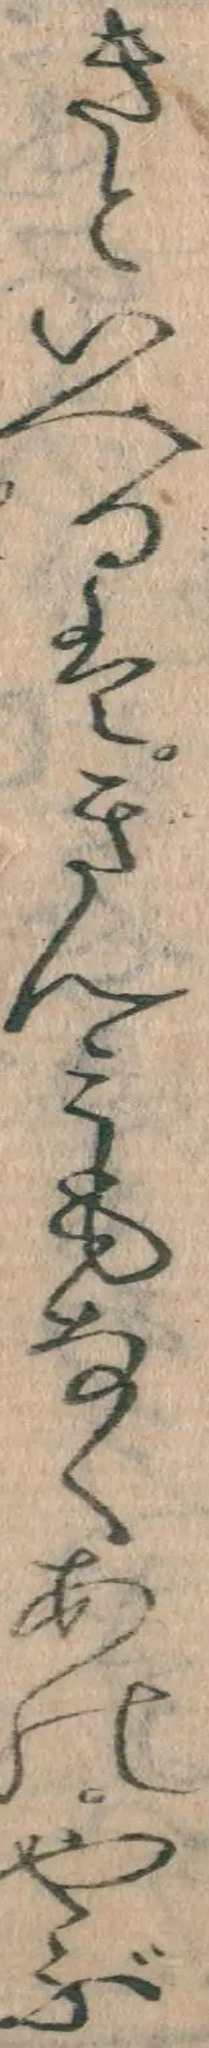きといへるは。きんみもなくあの。やぶ
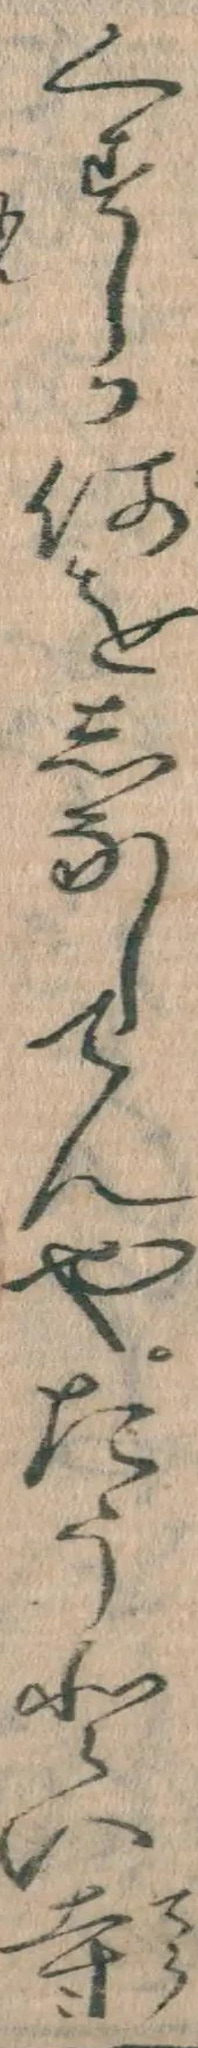くすしか何をしなしてんや。たうとい寺
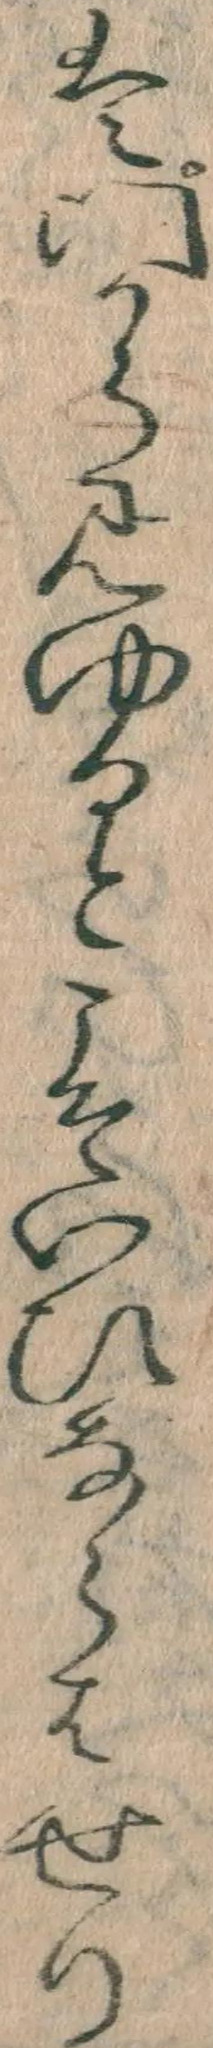は。門から見ゆるとこそいひならはせり
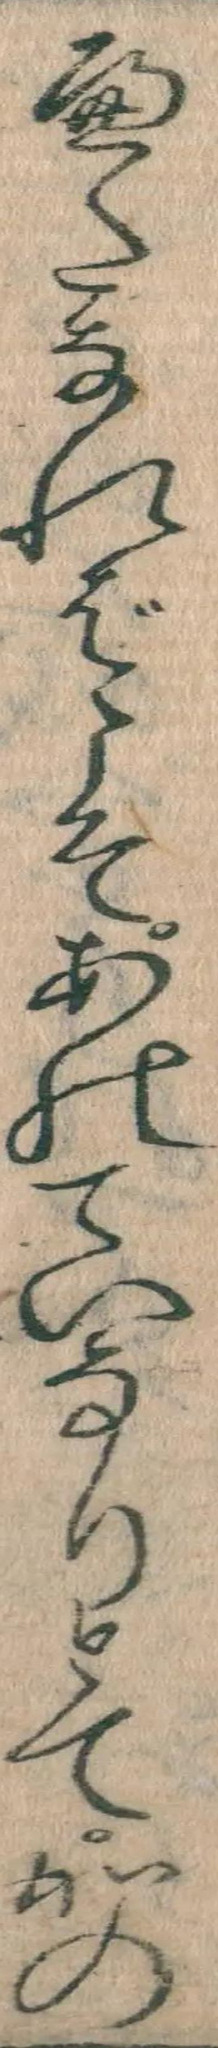へたなればこそ。あのていなりとて。かの
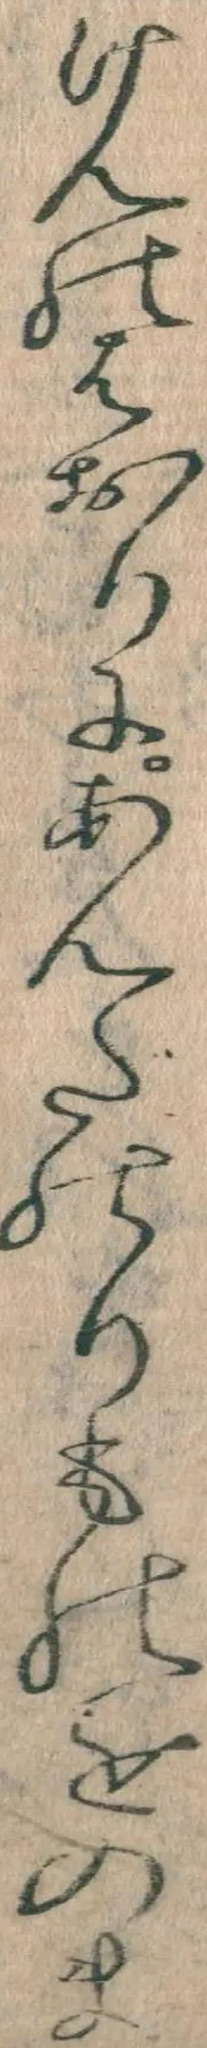けんのはおりに。あんだのりものをのま
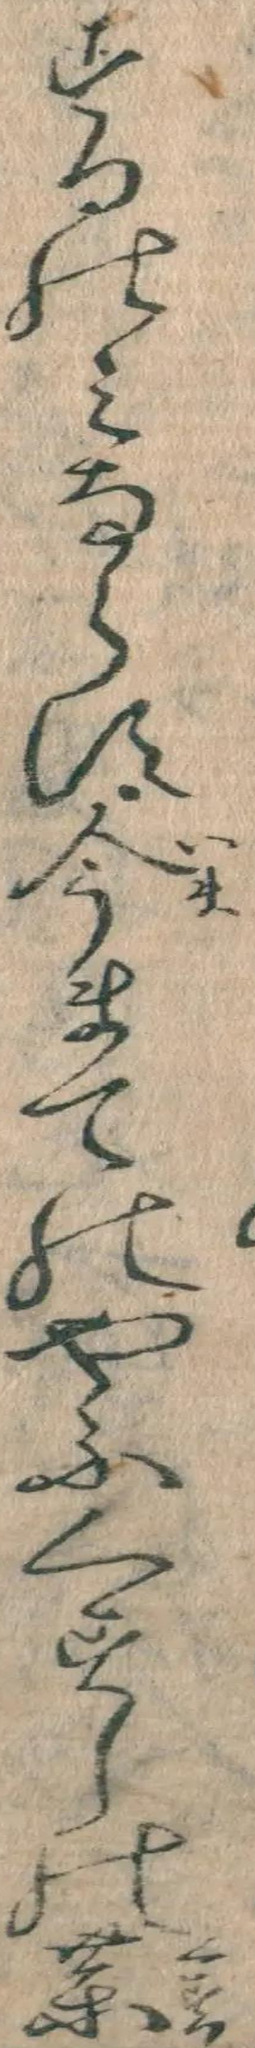するのみならす、今まてのやふくすしの薬
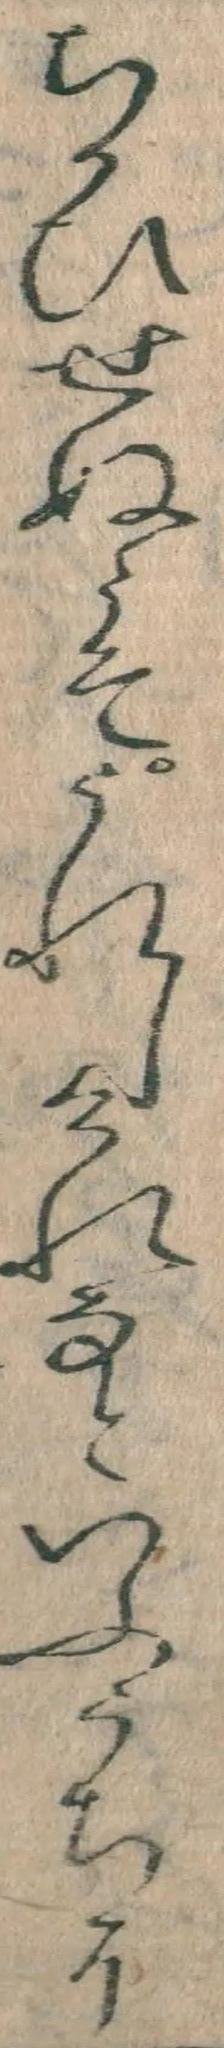ちかひせぬこそ。うれしけれなといふうちに
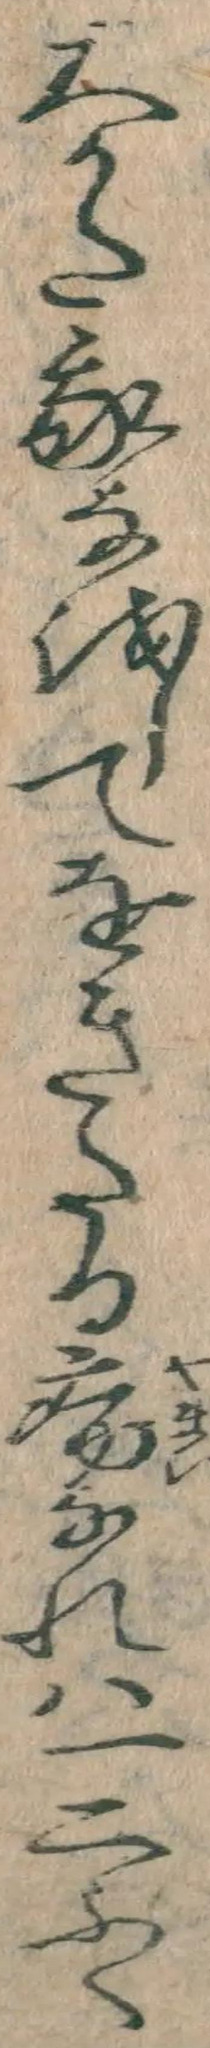大かた我なをしてをきたる病なれは一二ふく
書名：竹斎狂歌物語 3巻
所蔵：国立国会図書館 National Diet Library, JAPAN
